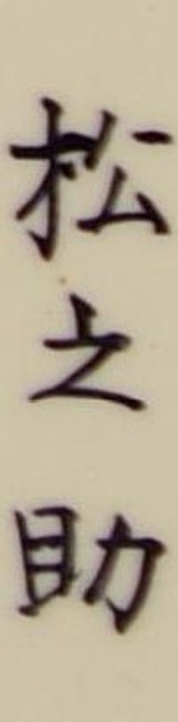松之助
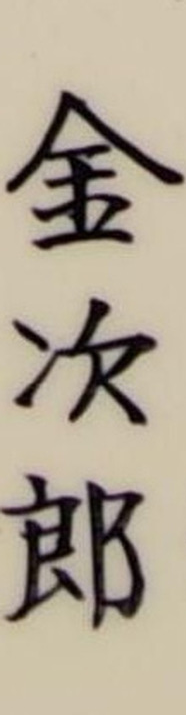金次郎
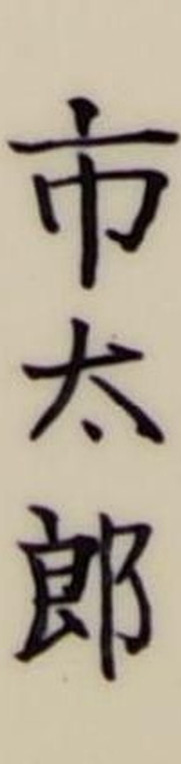市太郎
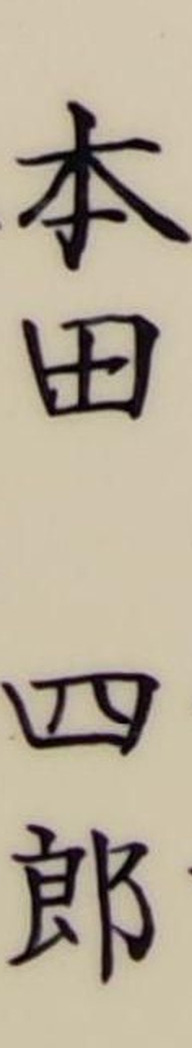本田四郎
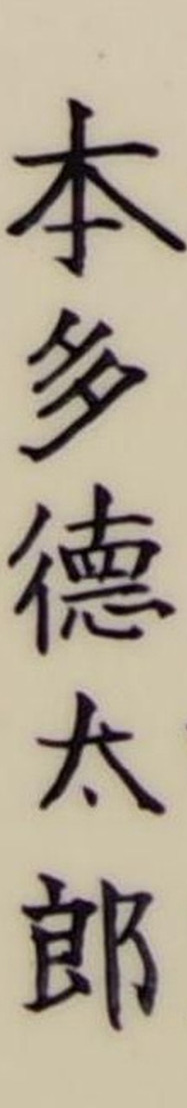本多徳太郎
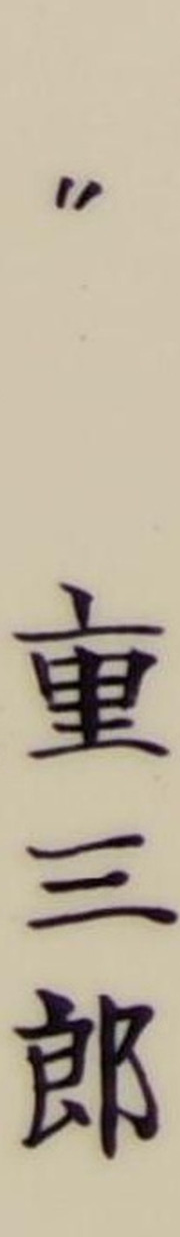重三郎
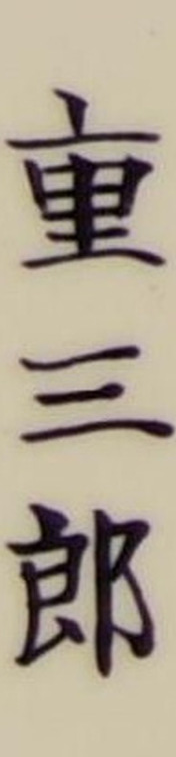重三郎
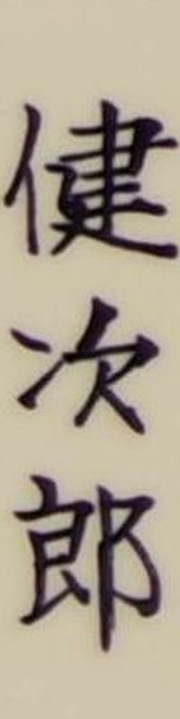健次郎
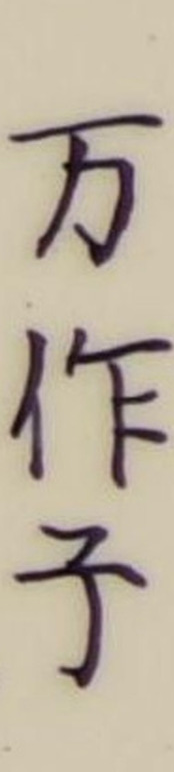万作子

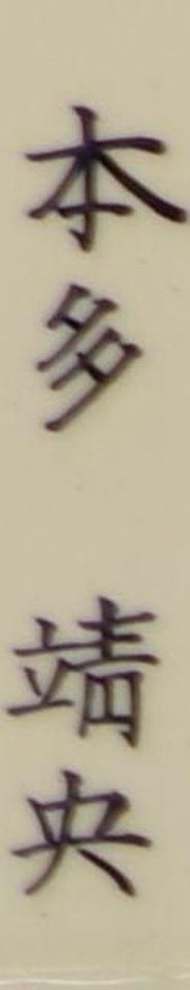本多靖央
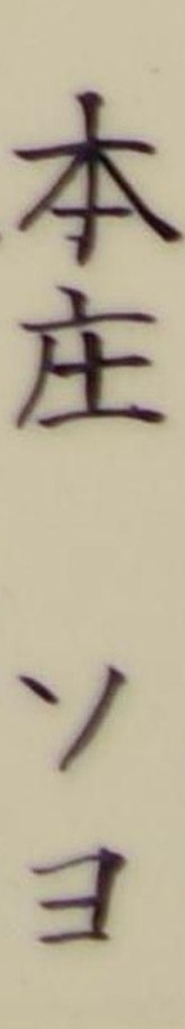本庄ソヨ
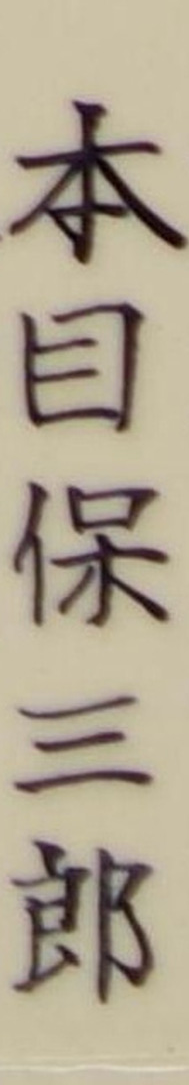本目保三郎
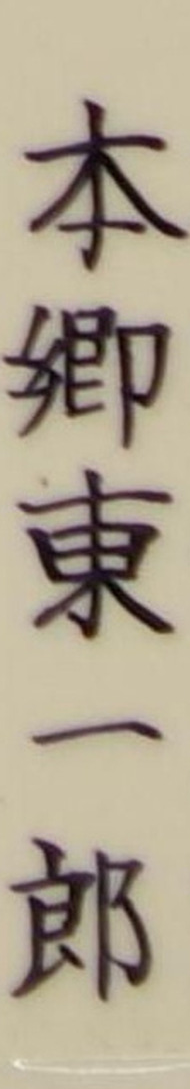本郷東一郎
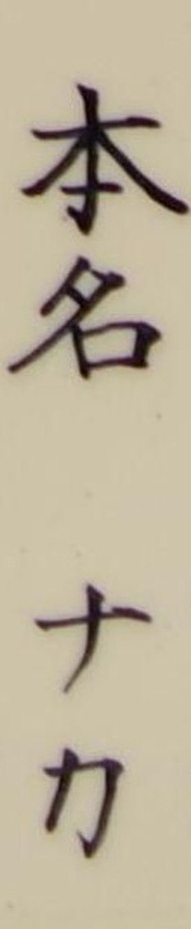本名ナカ
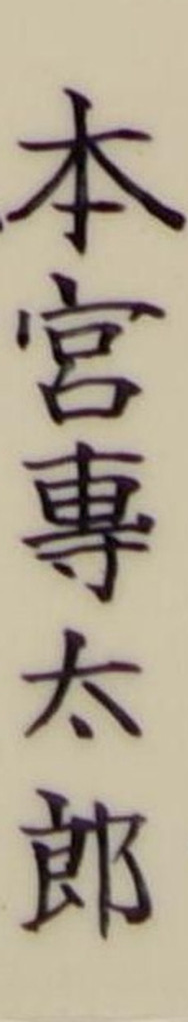本宮専太郎
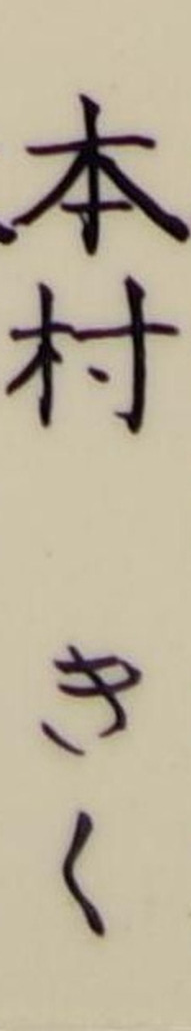本村きく
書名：A~D
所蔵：koyasan kongobuji
